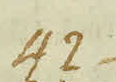42
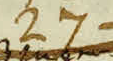27
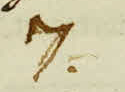7.
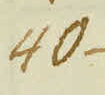40
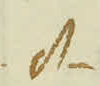8
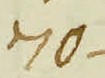70
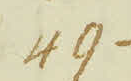49
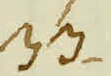33
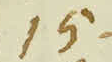15
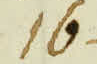16
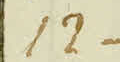12
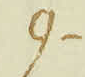9
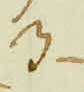3
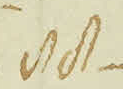88
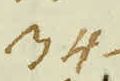34
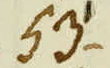53
